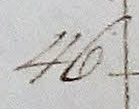46
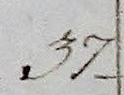37
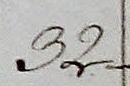32
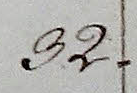32
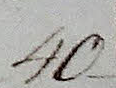40
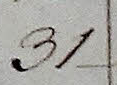31
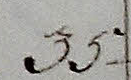35
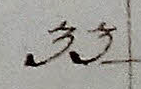33
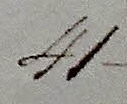41
